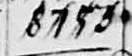8753
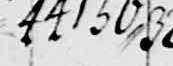44156
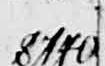8740
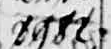2982
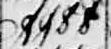9988
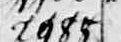2985
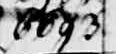6693
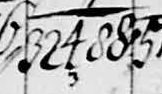32488
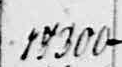15300
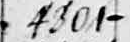4301
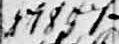17857
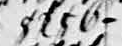5256
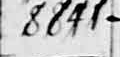8841
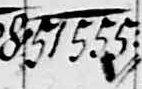51555
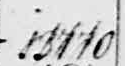13770
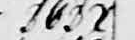3632
